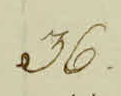36
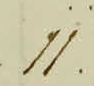11
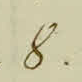8
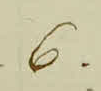6
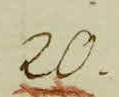20
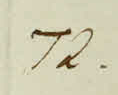72
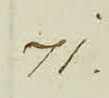71
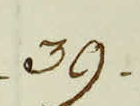39
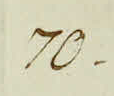70
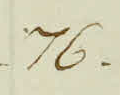76
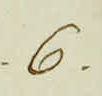6
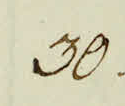30
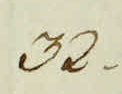32
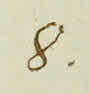8
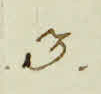3
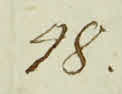48
